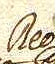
Reo
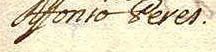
Affonso Peres.
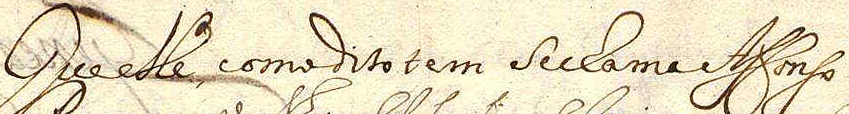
Que elle, como dito tem se chama Affonso
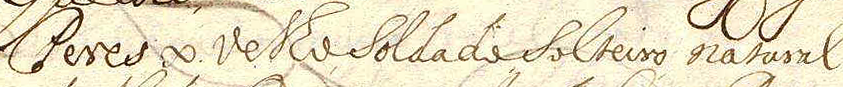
Peres x. velho Soldado Solteiro, natural
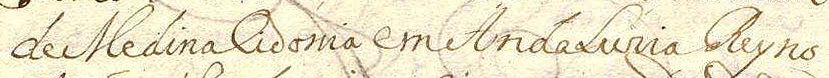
de Medina Cidonia em AndaLuzia Reyno
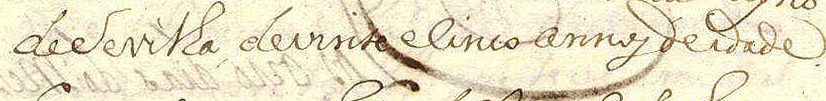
de Sevilha, de vinte e cinco annos de idade.
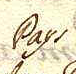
Pays
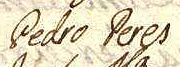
Pedro Peres
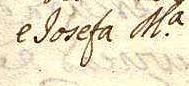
e Iosefa M.a
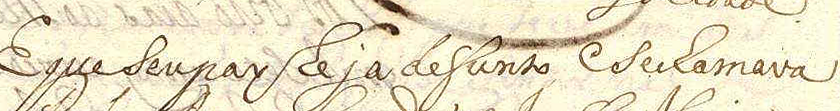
E que Seu pay he ja defunto, e se chamava
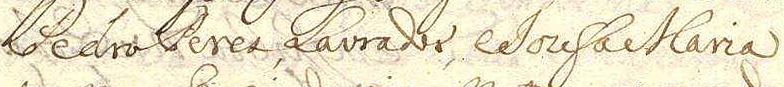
Pedro Peres, Lavrador, e Iozefa Maria
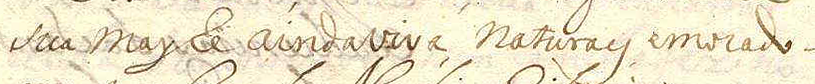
sua may he ainda viva, naturaes, e morado
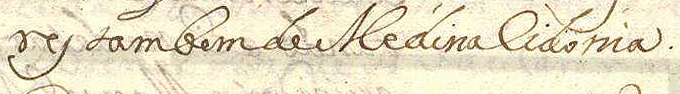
res tambem de Medina Cidonia.
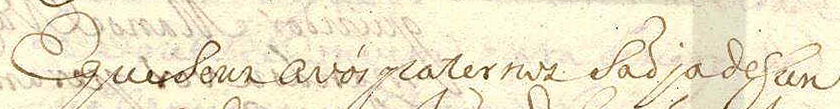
E que Seuz avós praternoz Saõ ja defun
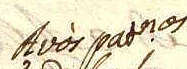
Avós pat.nos
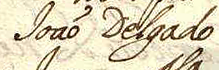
Ioaõ Delgado
